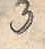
3
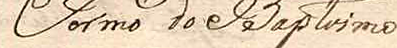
Termo do Baptismo
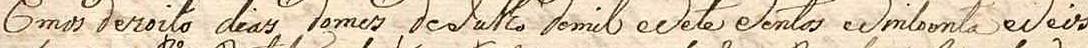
Em os dezoito dias do mes de Iulho de mil e SeteSentos e SinCoenta e Seis
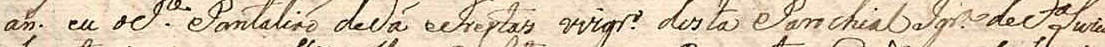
an.s eu o P.e Pantalião de Sá Freytas vvigr.o desta Parochial Igr.a de s̄.a Luzia
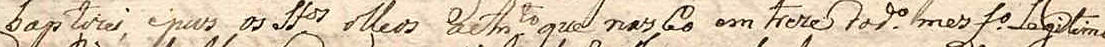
baptizei e pus os stos olleos a An.to que nasCeo em treze do d.o mes f.o legitimo
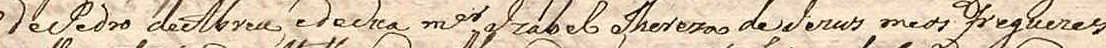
de Pedro de Abreu, e de sua m.er Izabel Thereza de Iezus meos freguezes
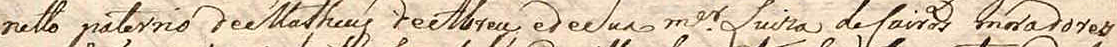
netto paterno de Matheus de Abreu e de sua mer. Luiza de Cairos moradores
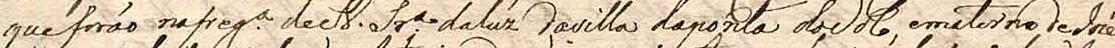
que forão na freg.a de N. Sr.a da lúz da villa da ponta do Sol, e materno de Iozé
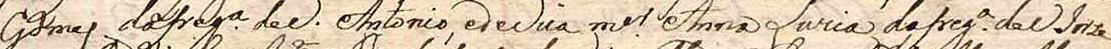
Gomes da freg.a de s. Antonio, e de sua m.er Anna Luzia da freg.a de s Iorze
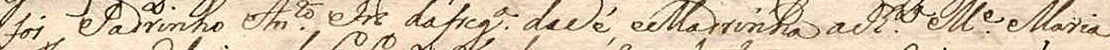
foi Padrinho An.to Frz̄ da freg.a da sé e Madrinha a R.da M.e Maria
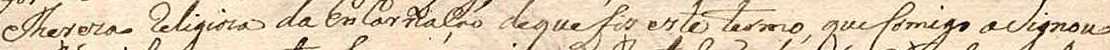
Thereza Religioza da EnCarnaÇão de que fis este termo que Comigo asignou
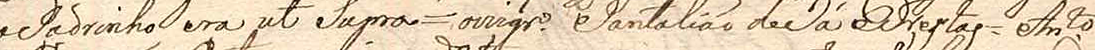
o Padrinho era ut Supra = o vvigr.o Pantaliaõ de sá Freytas= An.to
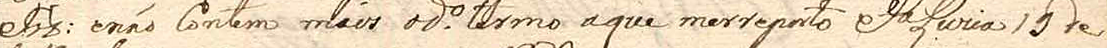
Frz̄: e não Contem mais o d.o termo a que me rreporto s.ta Luzia 19 de
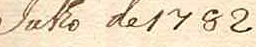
Iulho de 1782
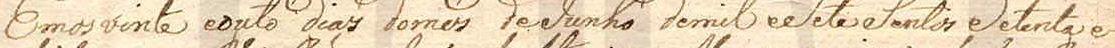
Em os vinte e outo dias do mes de Iunho de mil setesentos e setenta e
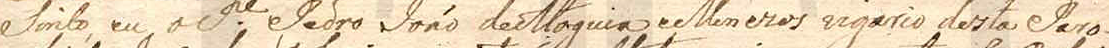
sinco eu o P.e Pedro Ioão de Ataguia Menezes vigario desta Paro
